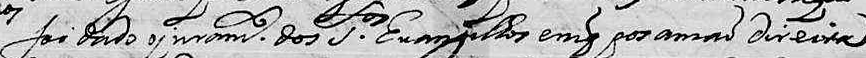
foi dado o juramto. dos S.tos Euangelhos em q̄ pos a maõ direita
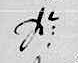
jde:
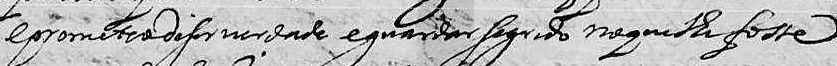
e prometeo diser uerdade e guardar segredo no que lhe fosse
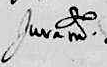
Juramto.
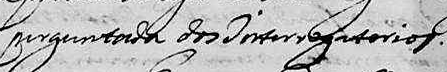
perguntada dos Interrogatorios.
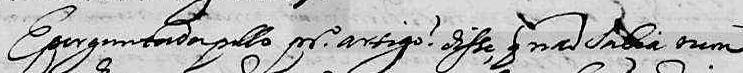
E perguntada pello pr.o artigo? disse, q̄ naõ sabia nem
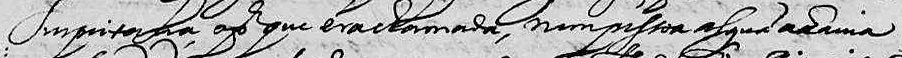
Suspeitaua, o pa que era chamada, nem pessoa alguā a hauia
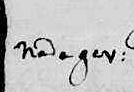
nada ger:
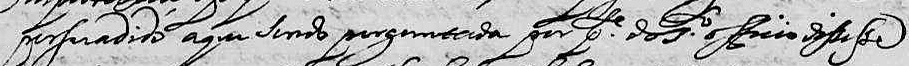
persuadido a que sendo perguntada por pte. do s.to officio dissesse
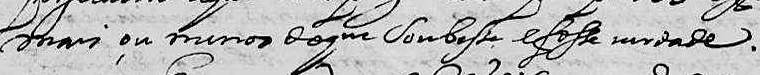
mais ou menos do que Soubesse e fosse uerdade.
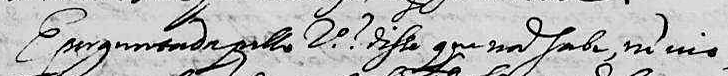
E perguntada pello 2.o? disse que nā sabe, nē uio
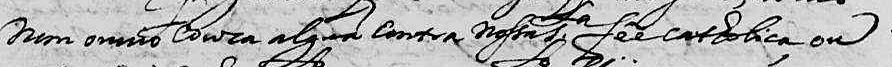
nem ouuio couza alguā contra nossa s.ta fee catholica, ou
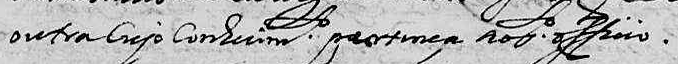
outra cujo conhecim.to pertença ao s.to officio.
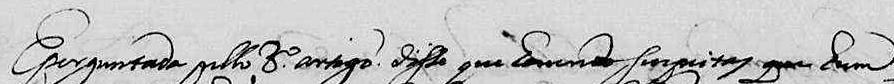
E perguntada pello 3.o artigo? disse que hauendo suspeitas que hum
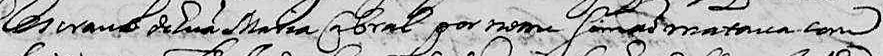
escrauo de huā Maria Cabral por nome simaõ mataua com
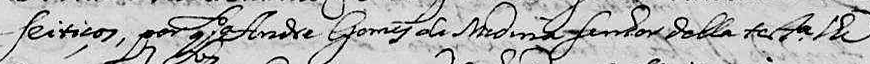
feitiços, porq.to Andre Gomes de Medina senhor della test.a lhe
